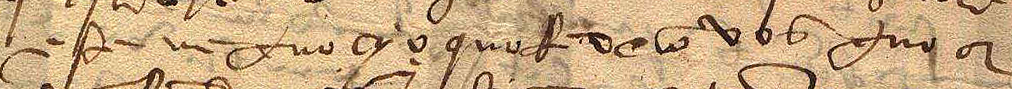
este neguocyo quoRe e q̄ vos guoar
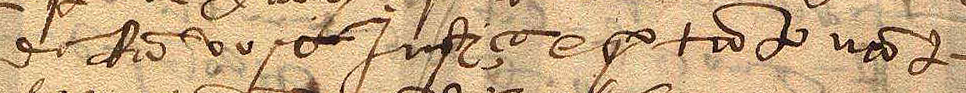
daRā vosa Justyça e p̄otāto nā te
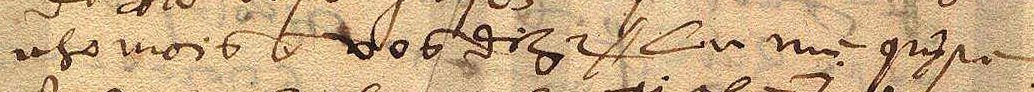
nho mais q̄ vos dizer // Eu me quyse
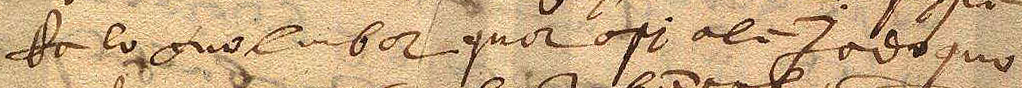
Ra loguo embarquar asy aleJado quo
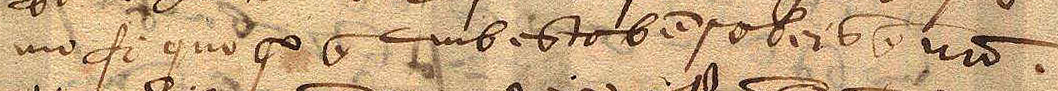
mo fiquo p̄oq̄ em besta bē sabeis q̄ nā
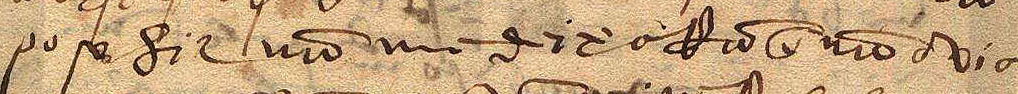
poso hir nā me deixaRā q̄ nā avia
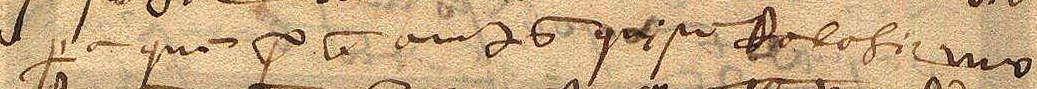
ꝑa que p̄oq̄ antes quiseRa la hir mo
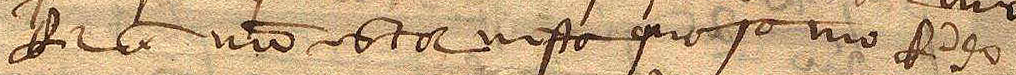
Rer q̄ nā esta nesta quasa moRēdo
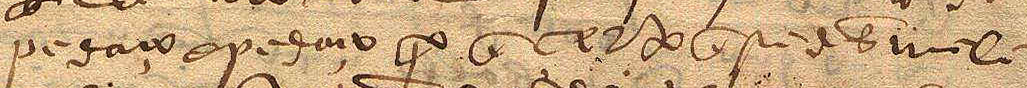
pedaço e pedaço p̄oq̄ certo q̄ se des̄ me le
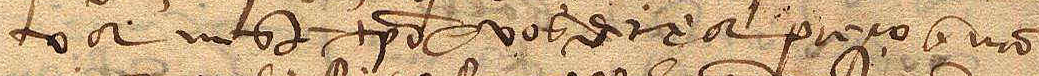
var neste tpō e vos deixar preso q̄ nā
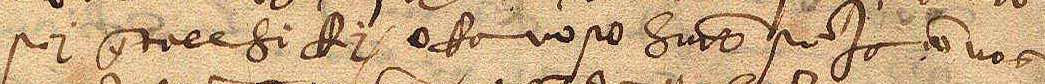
sey q̄ tall hiRey / oRa noso Senōr seJa cōnos
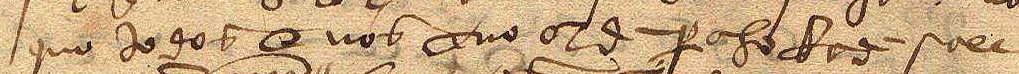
quo todos e nos guoarde ꝑ a hoRa de sall
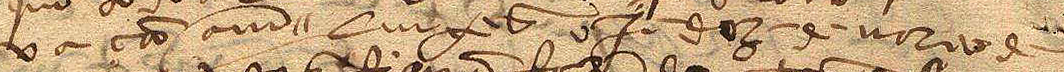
vaçā am̄ // Em ges oJe doze de março de
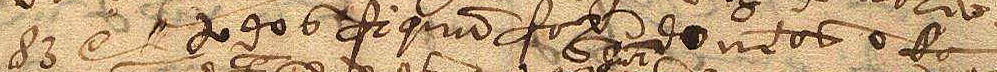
83 ā // todos fiquā fazēdo mtas oRa
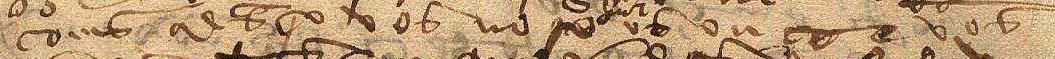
çoens a des̄ p̄o vos noso Sōr os ouça e vos
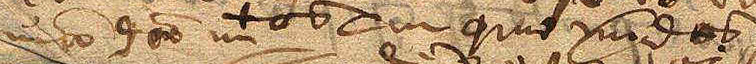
mādā mtas emquomēdas
